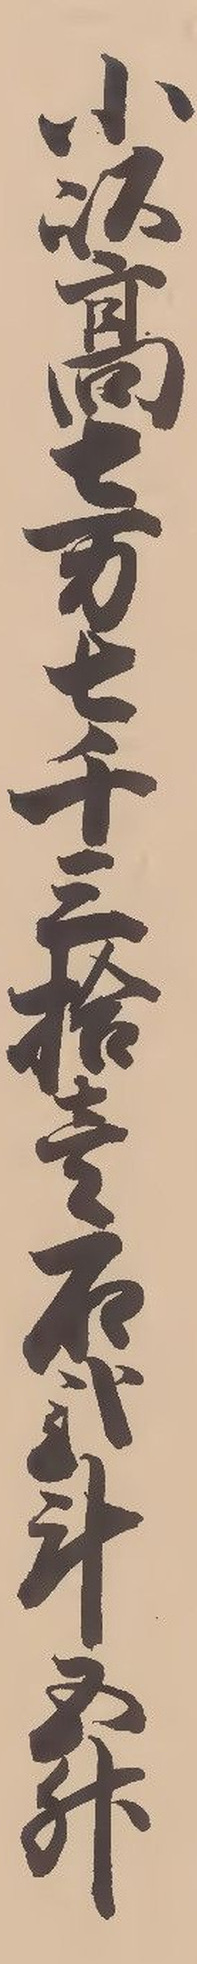小以高七万七千三拾壱石弐斗五升
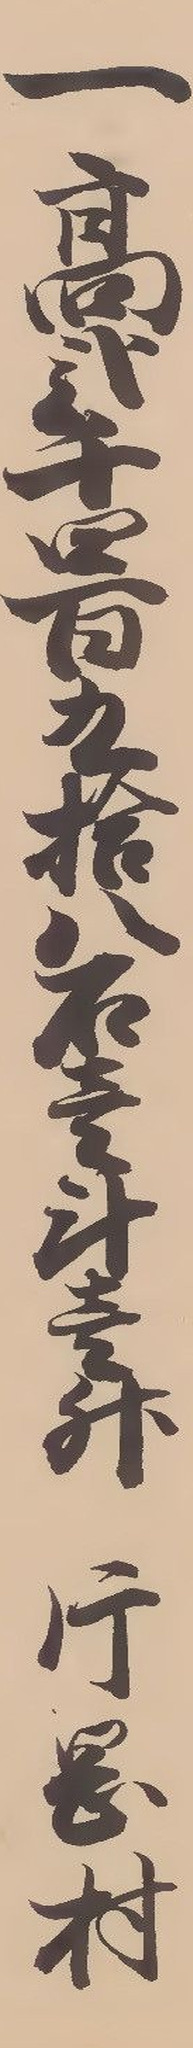一高弐千四百九拾八石壱斗壱升片岡村
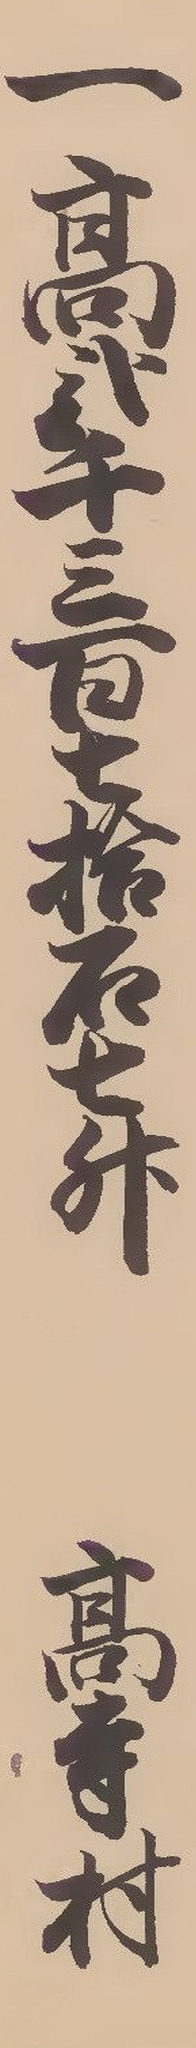一高弐千三百七拾石七升高寺村

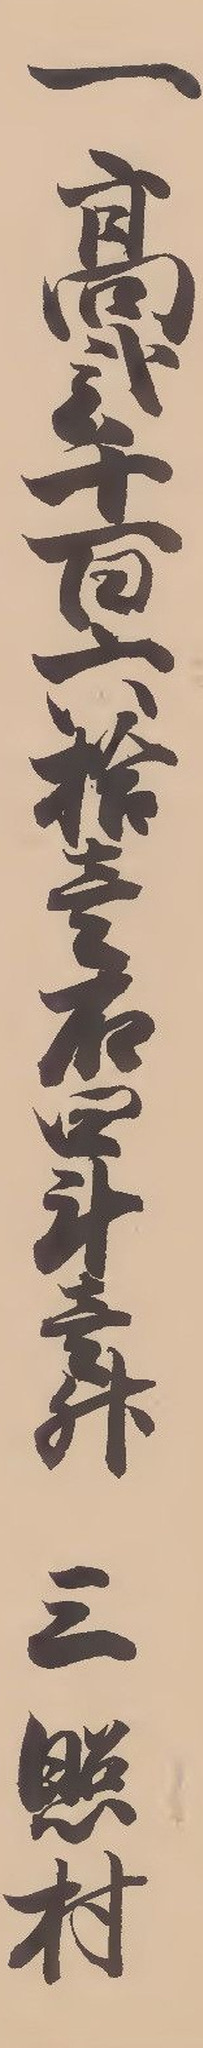一高弐千百六拾壱石四斗壱升三照村
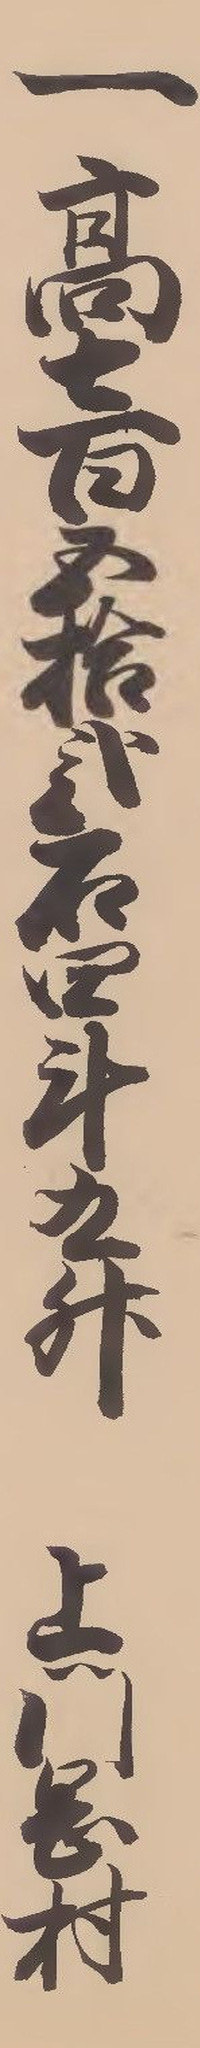一高七百五拾弐石四斗九升上門岡村
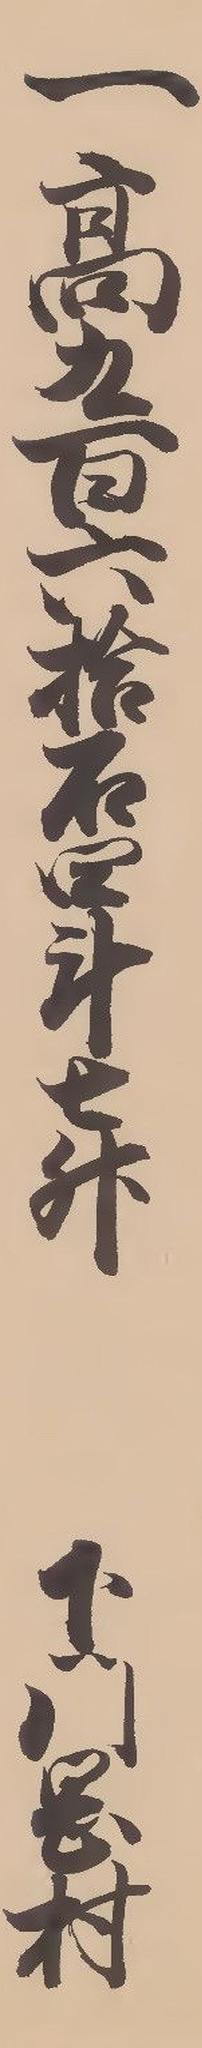一高九百六拾石四斗七升下門岡村
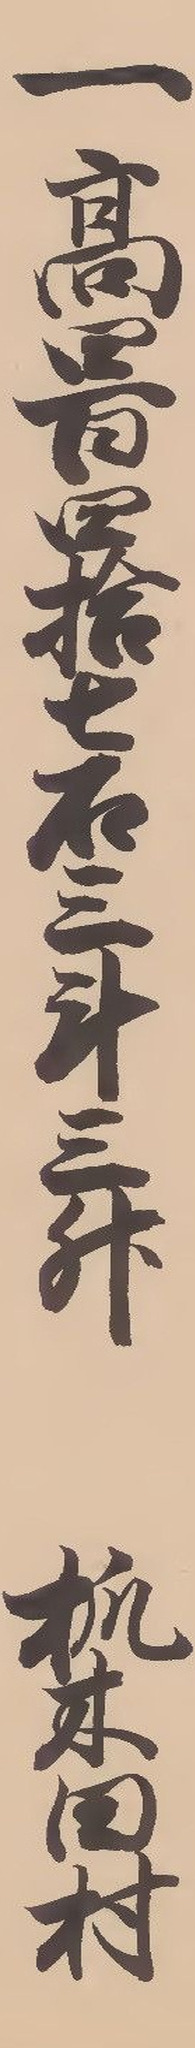一高四百四拾七石三斗三升枛木田村
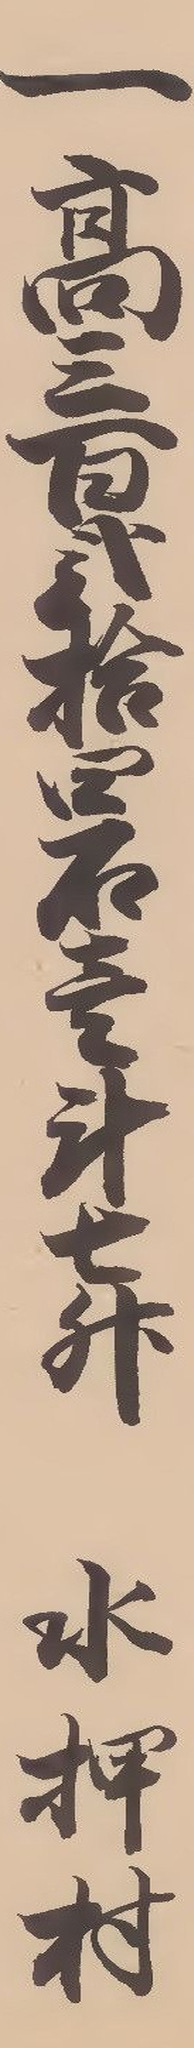一高三百弐拾四石壱斗七升水押村
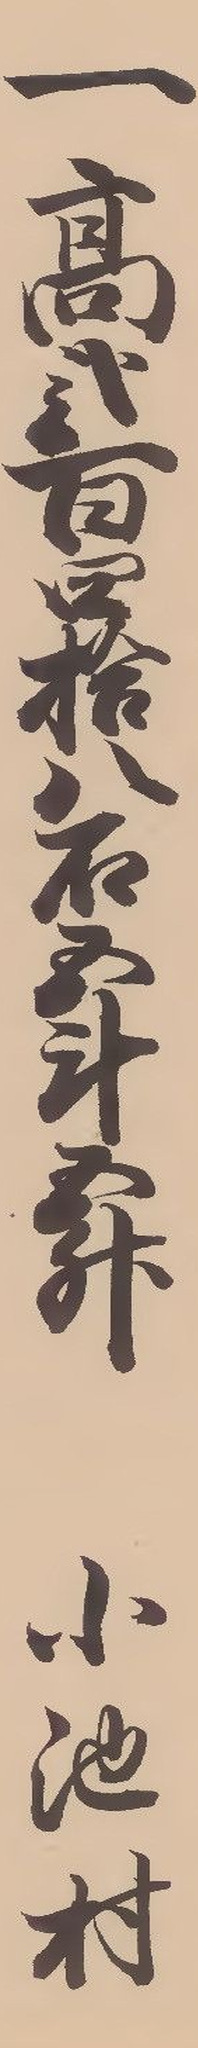一高弐百四拾八石五斗五升小池村
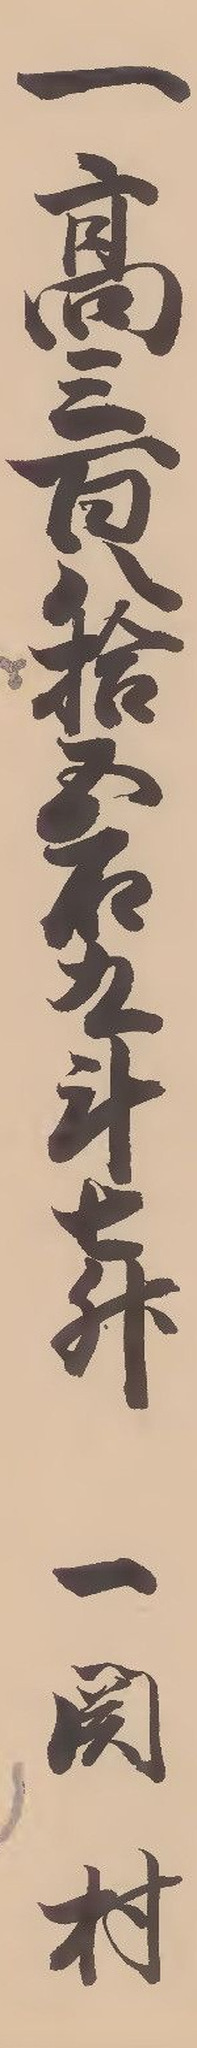一高三百八拾五石九斗七升一関村

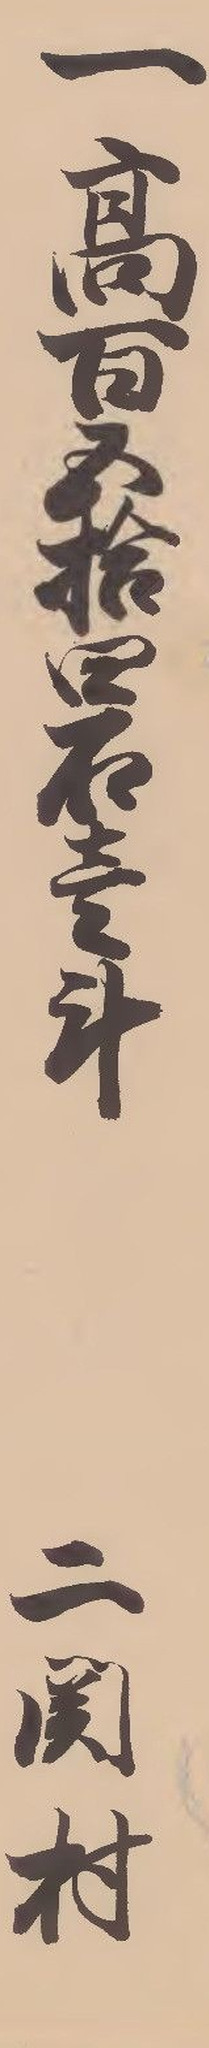一高百五拾四石壱斗二関村
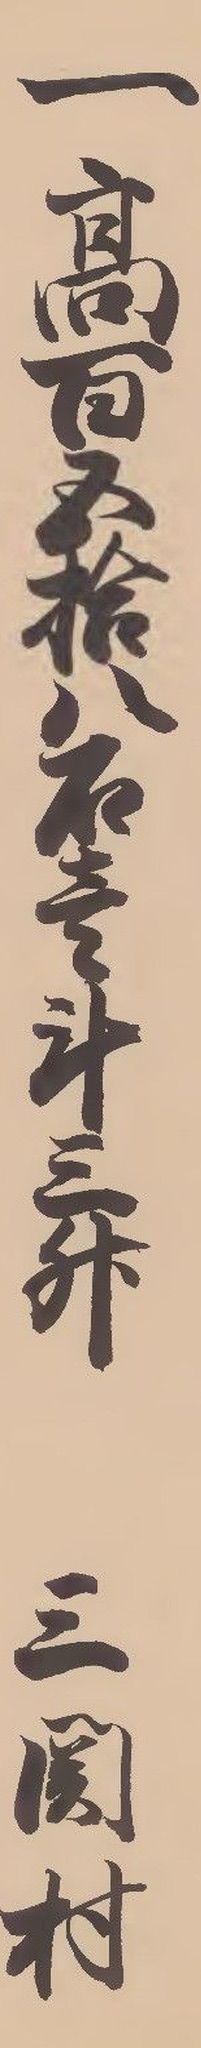一高百五拾八石壱斗三升三関村
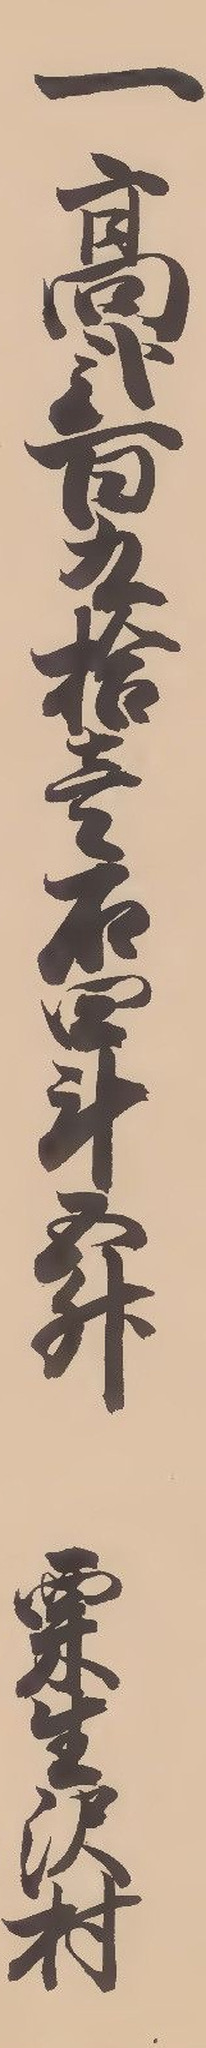一高弐百九拾壱石四斗五升栗生沢村
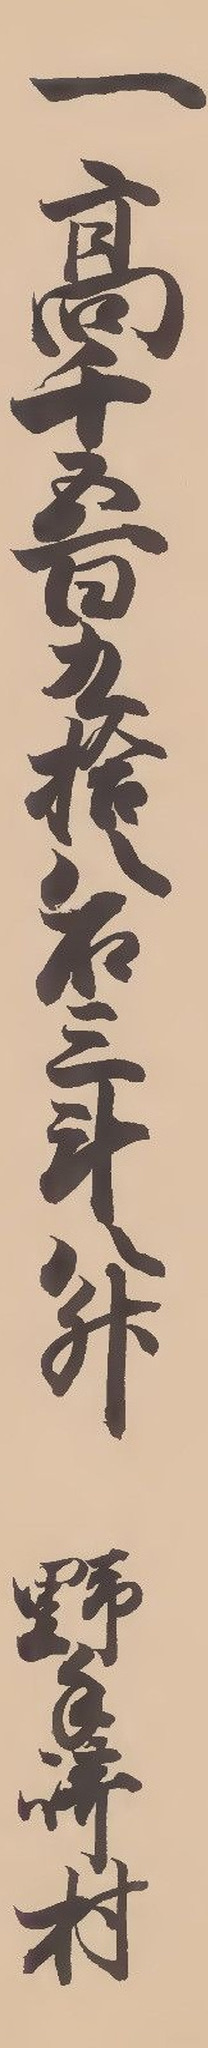一高千五百九拾八石三斗八升野手崎村
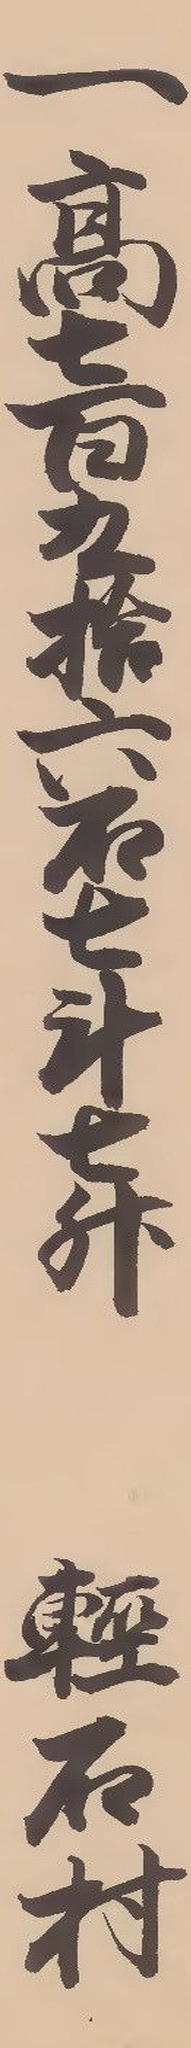一高七百九拾六石七斗七升軽石村
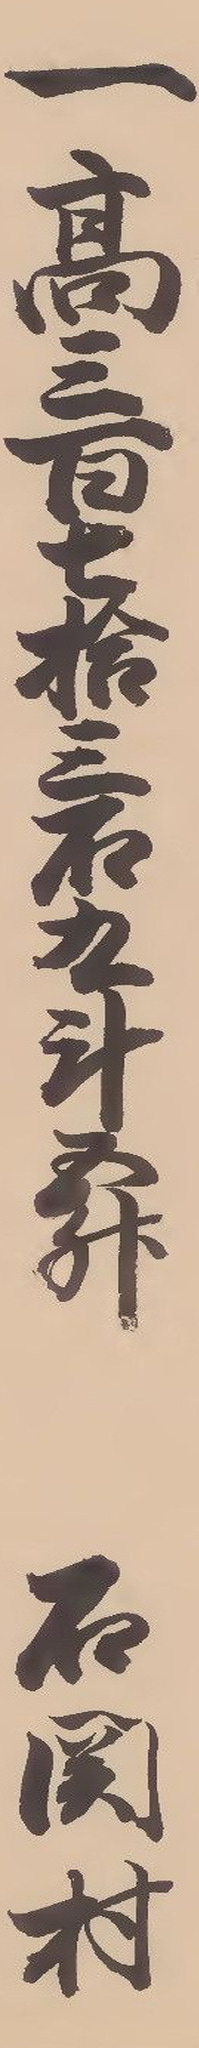一高三百七拾三石九斗五升石関村
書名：陸奥国郷帳　５
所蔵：国立公文書館 National Archives of Japan
